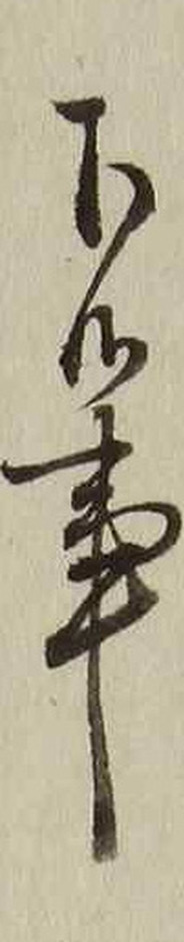下候事
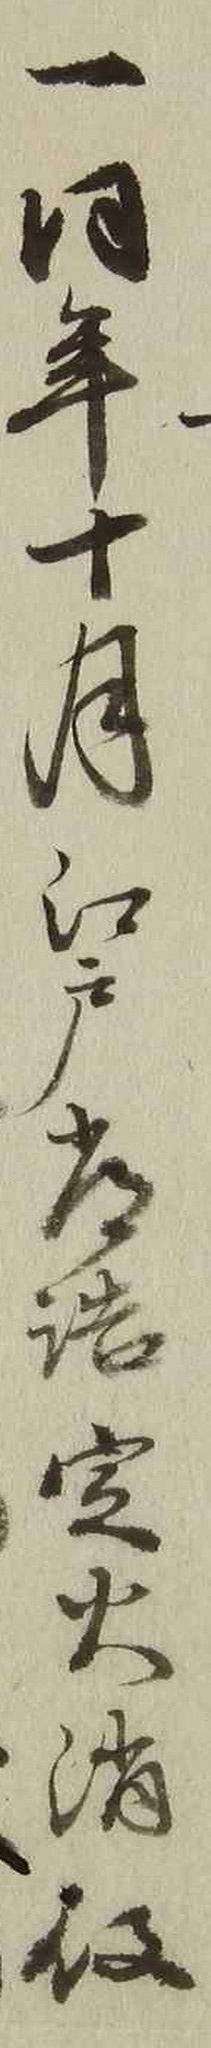一同年十月江戸常詰定火消役
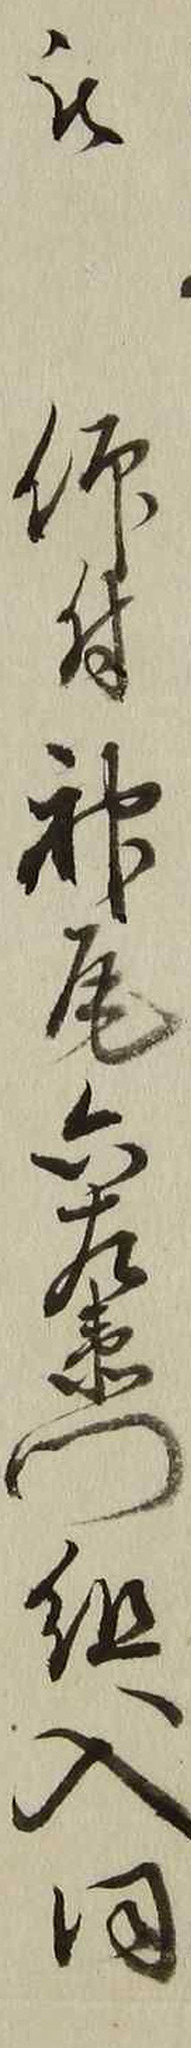被仰付神尾六左衛門組へ入同
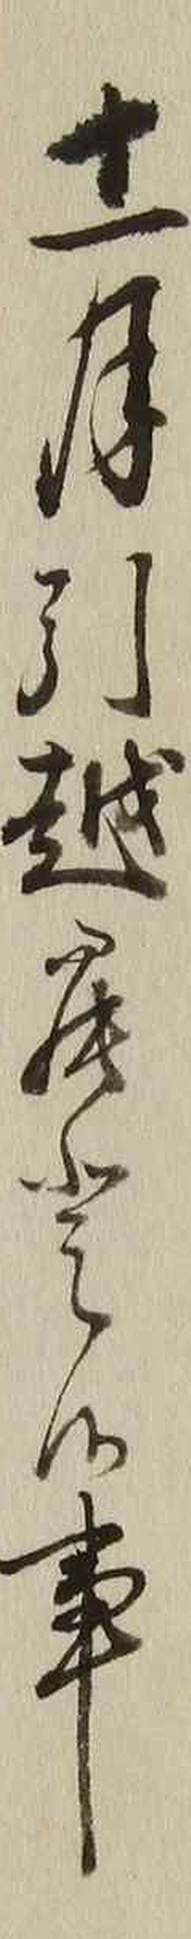十一月引越罷登候事
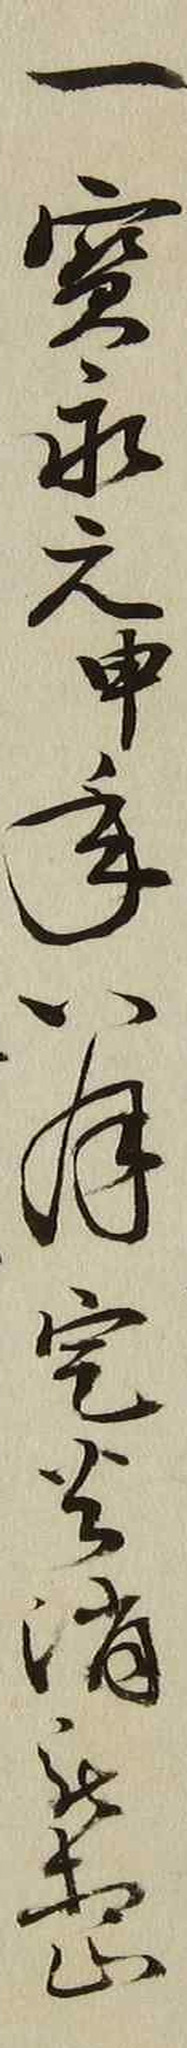一宝永元申年八月定火消被相止
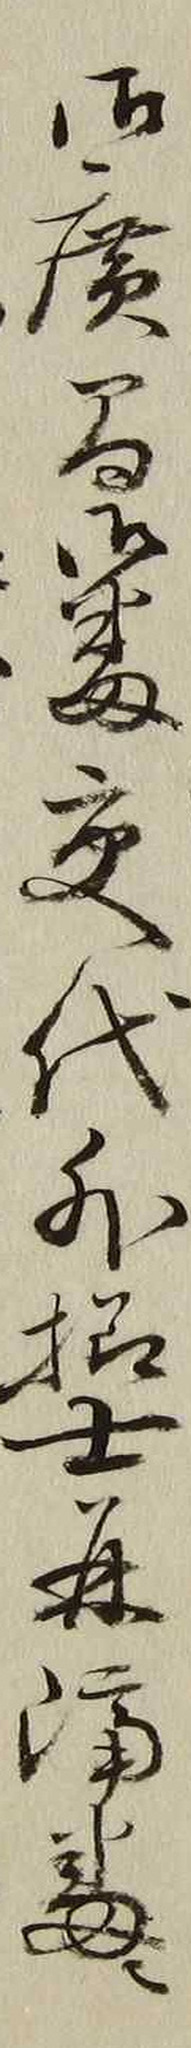御広間御番交代外様士再隔番ニ
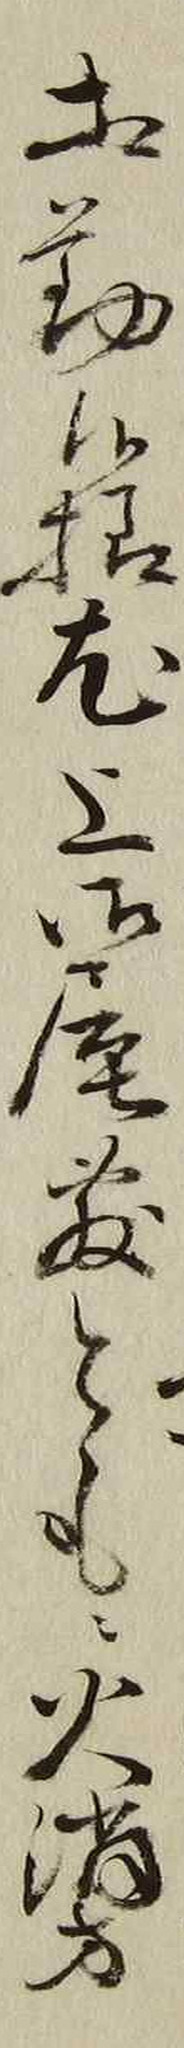相勤候様尤上御屋敷ともニ火消方
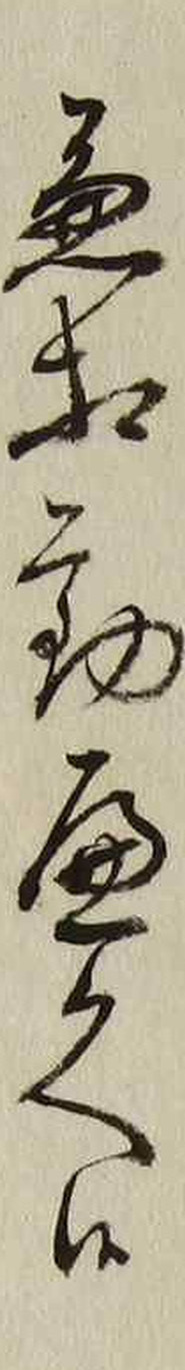兼相勤へく候
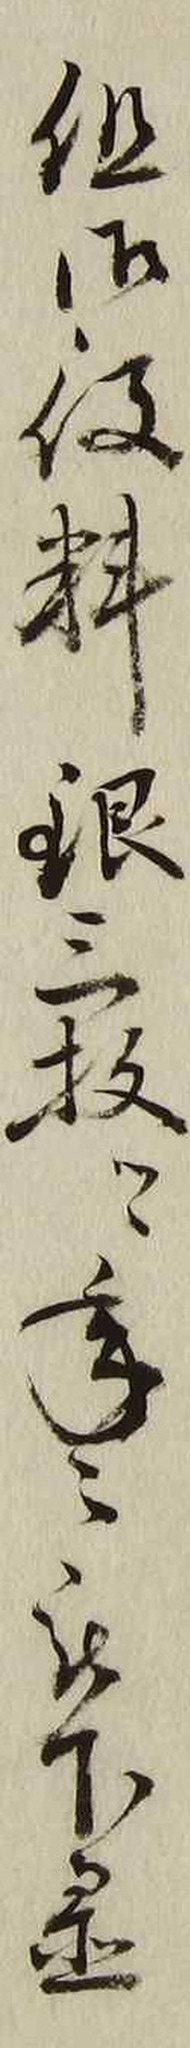但御役料銀三枚ツヽ年々被下置
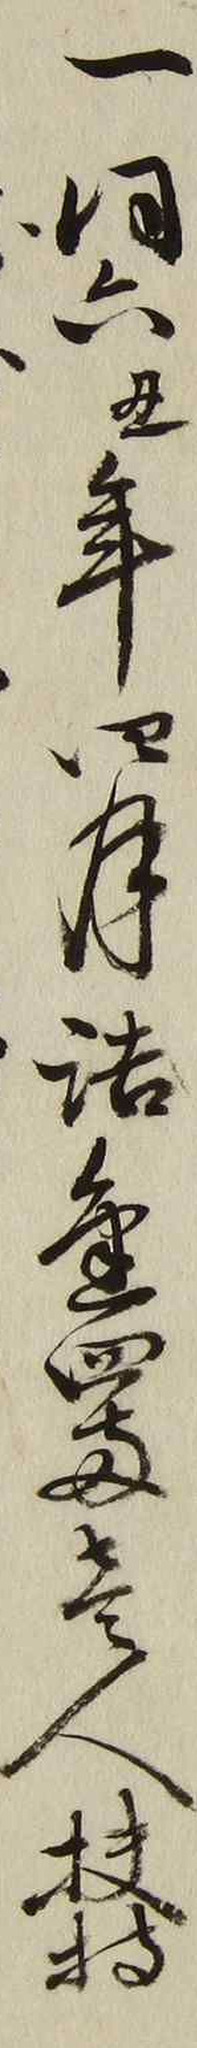一同六丑年四月詰金四両壱人扶持
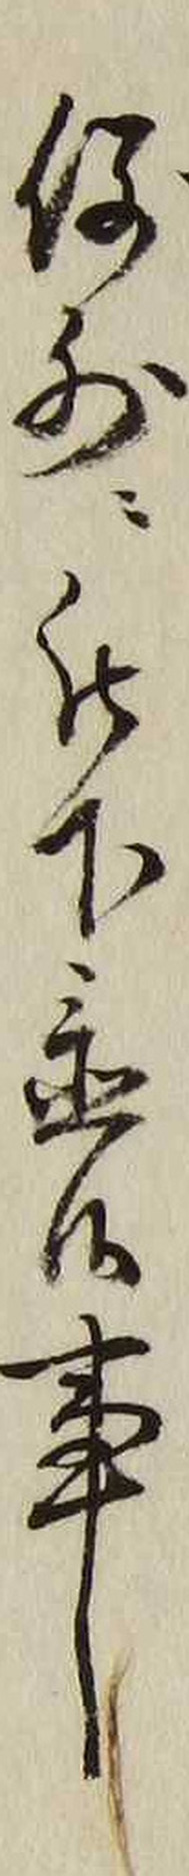例外ニ被下置候事
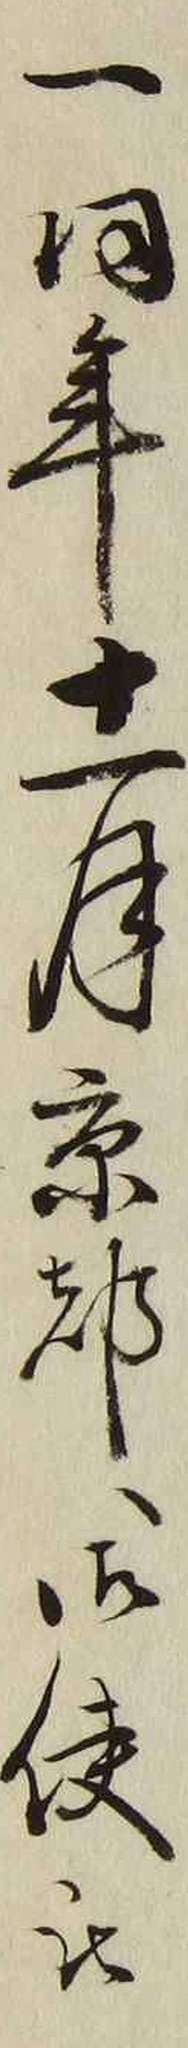一同年十一月京都へ御使被

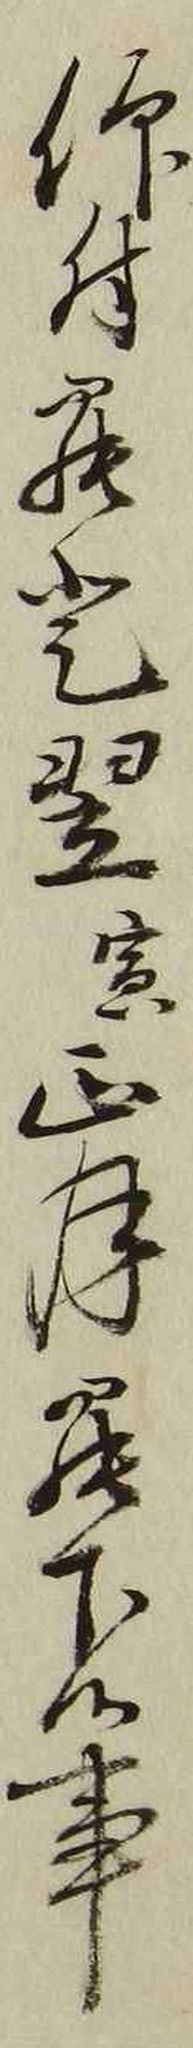仰付罷登翌寅正月罷下候事
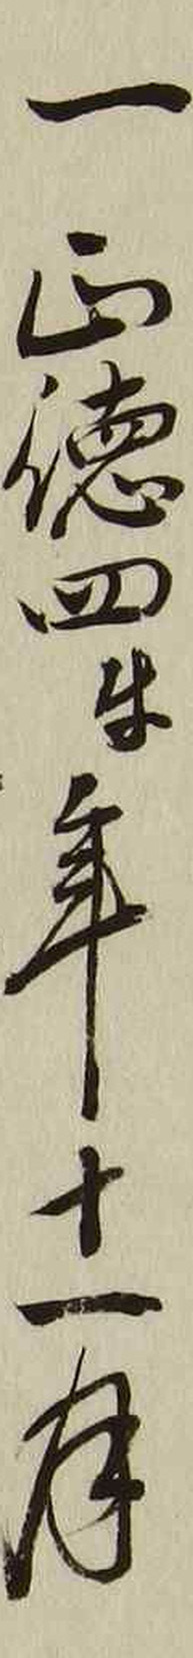一正徳四午年十一月
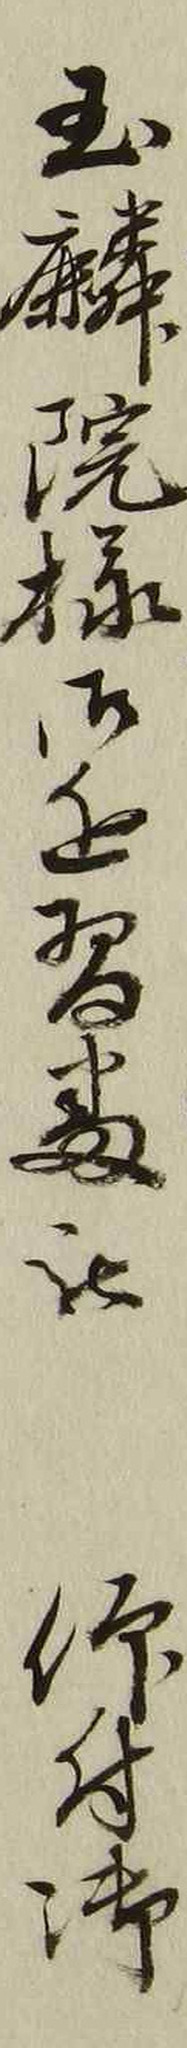玉麟院様御近習番被仰付御
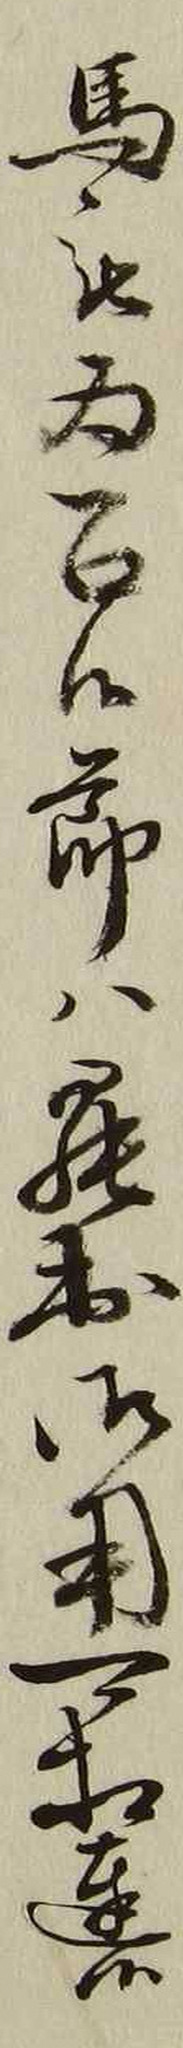馬被為召候節ハ罷出御用可相達候
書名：諸士系譜　巻之35　は之部3
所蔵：会津若松市立会津図書館
